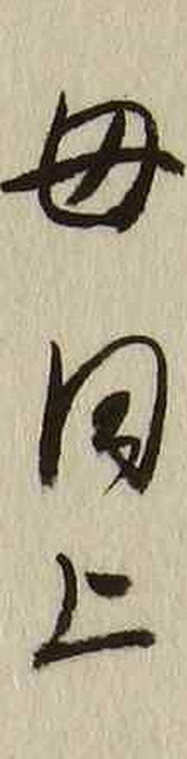母同上
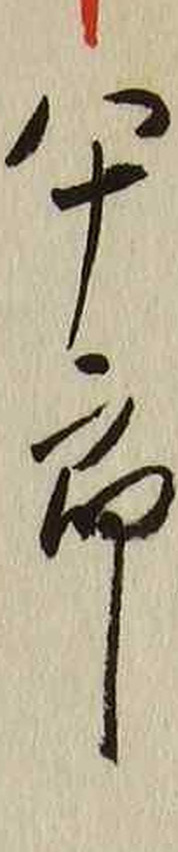八十郎
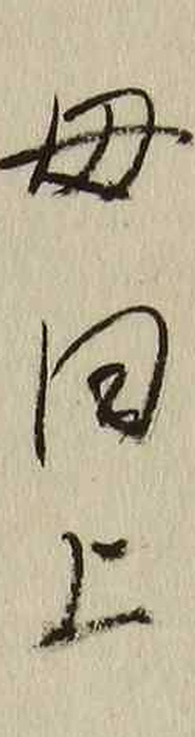母同上
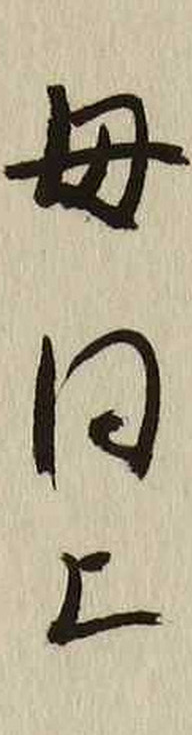母同上
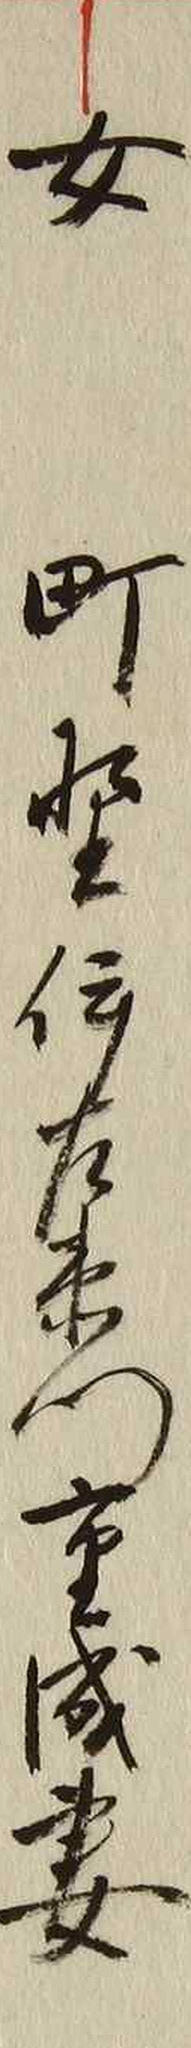女町野伊左衛門重成妻
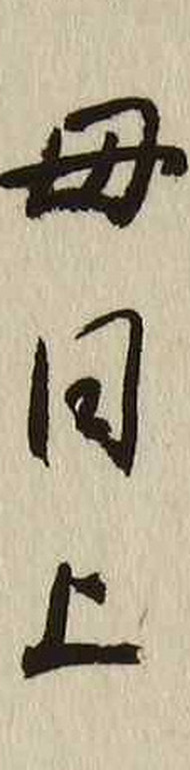母同上
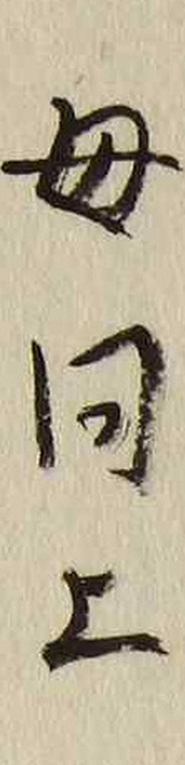母同上

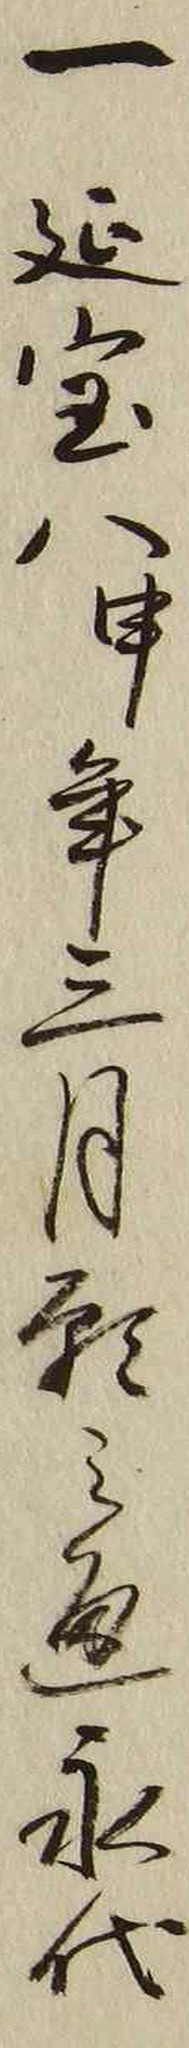一延宝八申年三月願之通永代
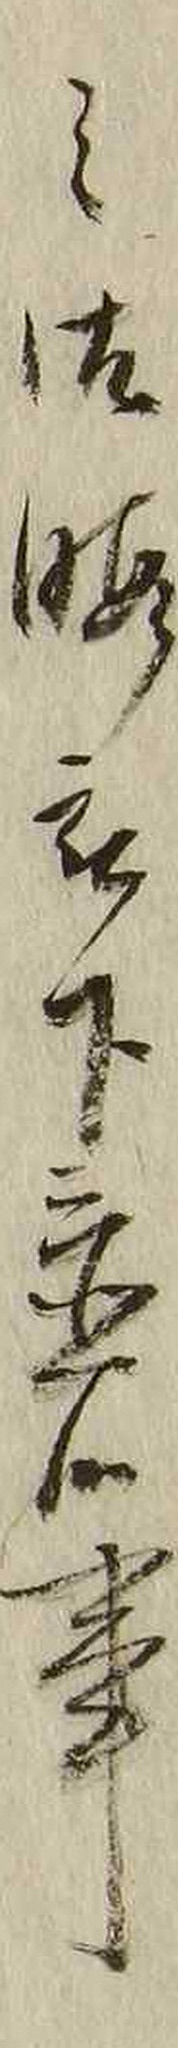之御暇被下置候事
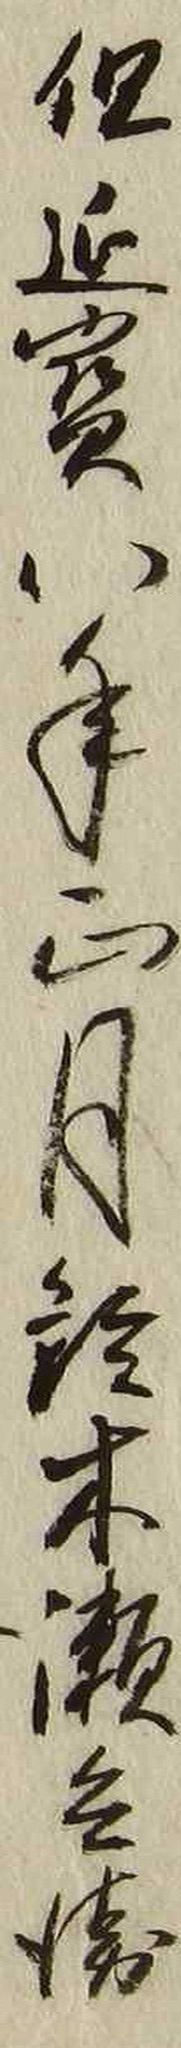但延宝八年正月鈴木瀬兵衛
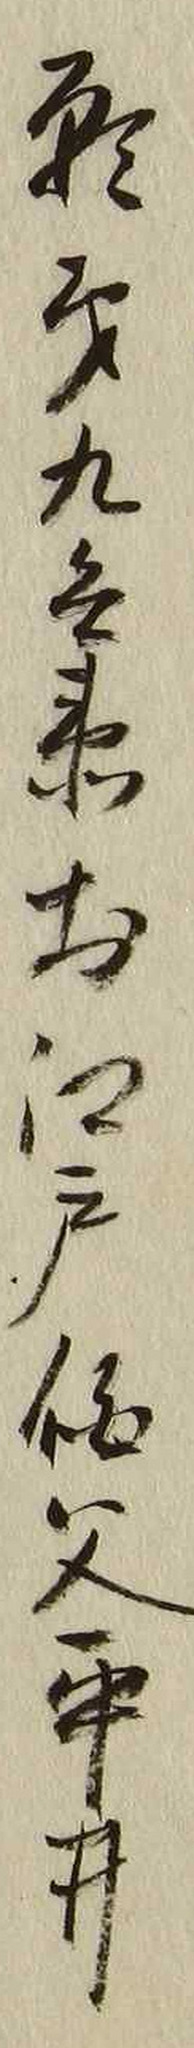願弟九兵衛於江戸伯父平井
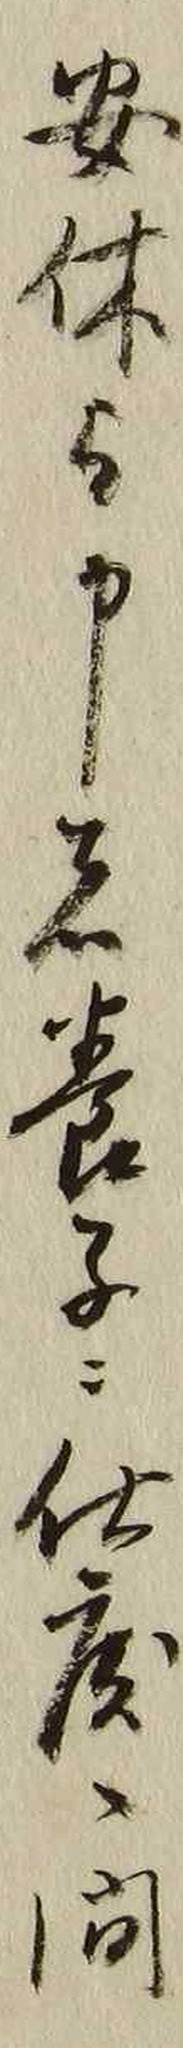安休与申者養子ニ仕度候間
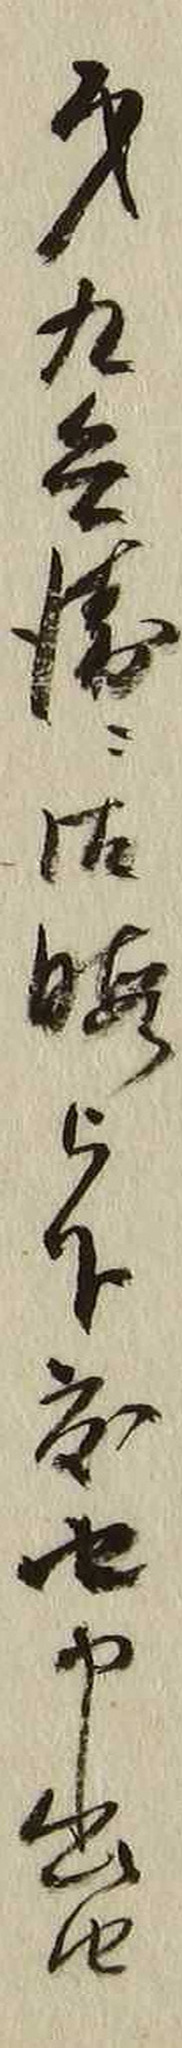弟九兵衛ニ御暇被下度由申出由
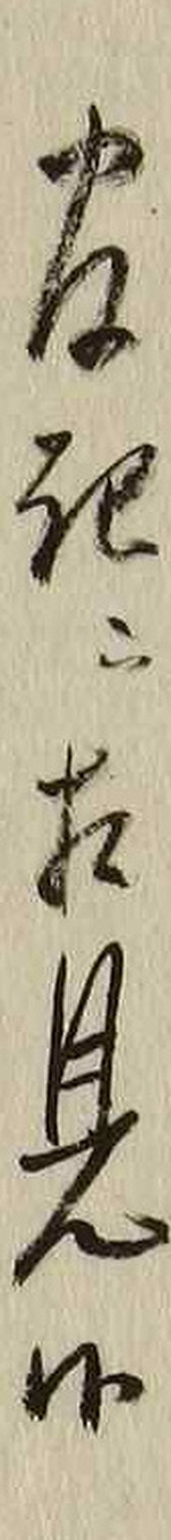官記ニ相見候
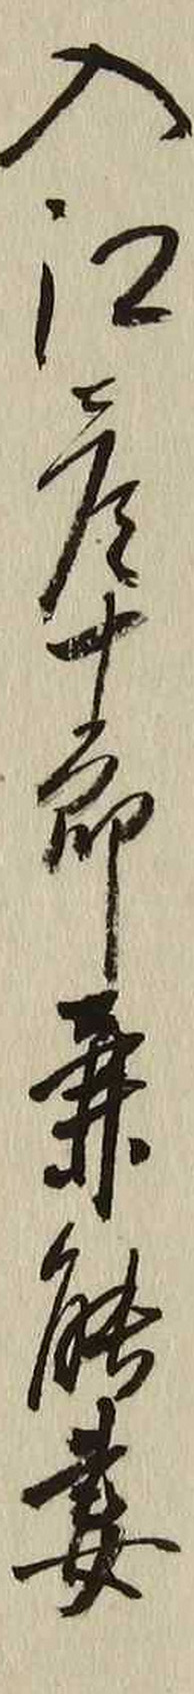女入江彦十郎兼能妻
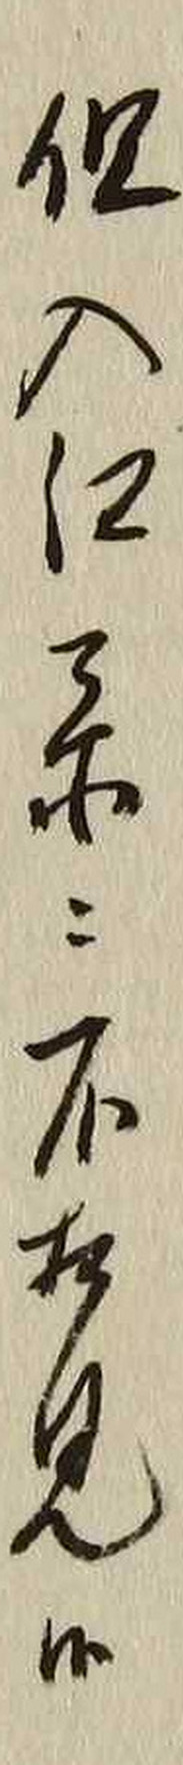但入江系ニ不相見候
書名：諸士系譜　巻之356　す之部6
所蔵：会津若松市立会津図書館
